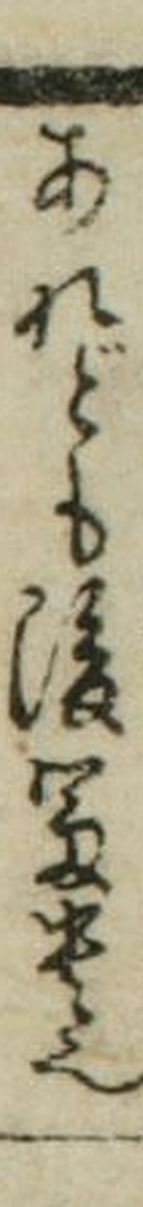あれども後富貴也
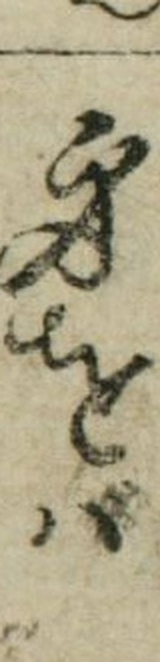身をば
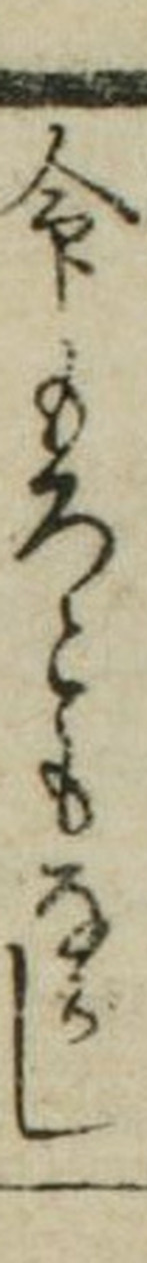命もろともながし
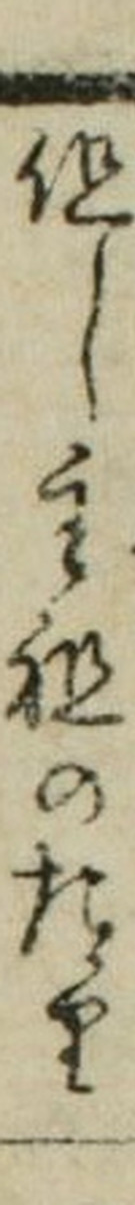但し主祖のたゝり
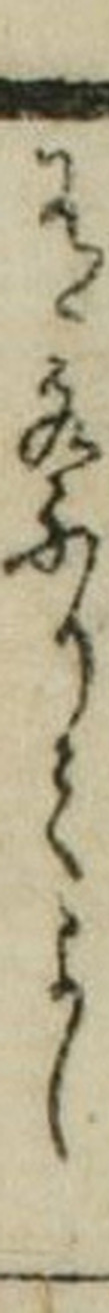有祭り之よし
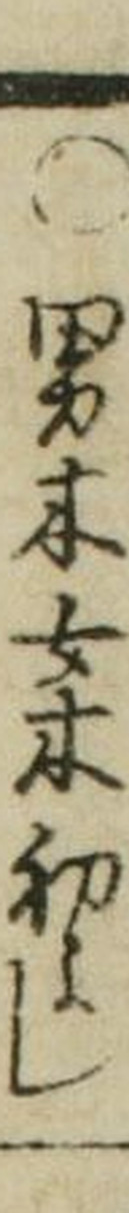○男木女木初よし
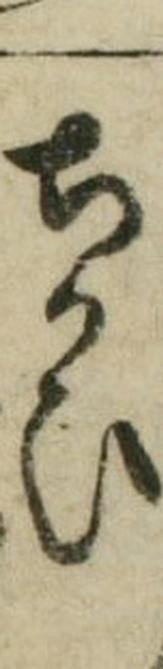ちかひ
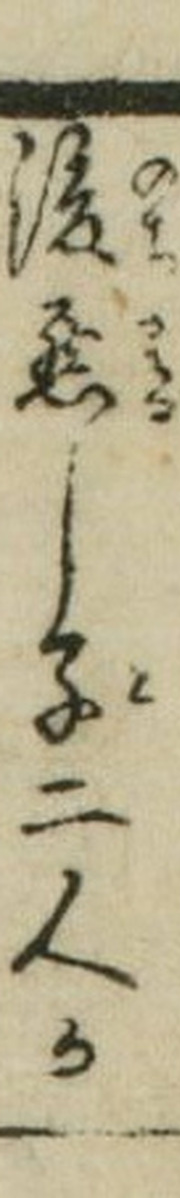後悪し子二人か
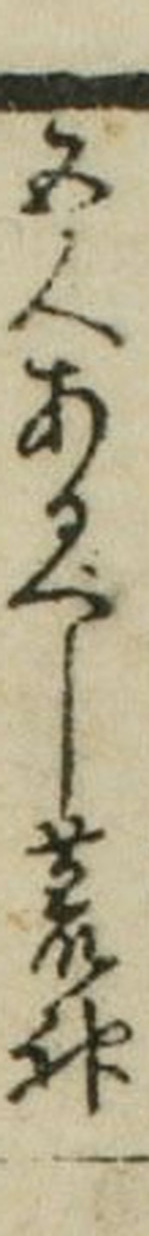五人あるべし荒神
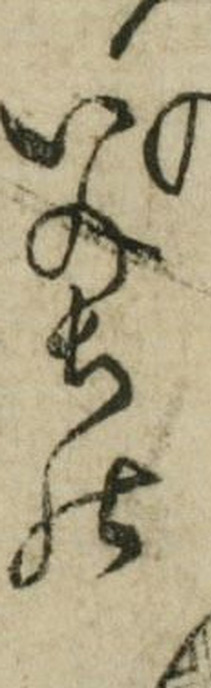いのちの
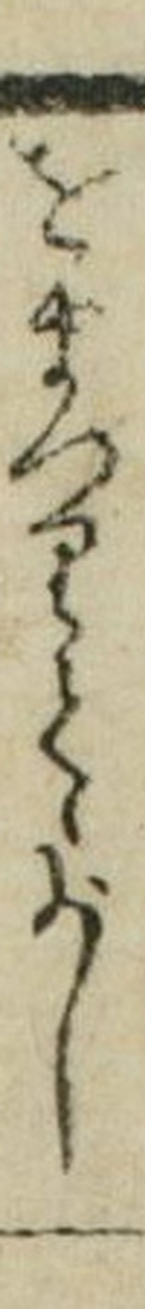をまつりてよし
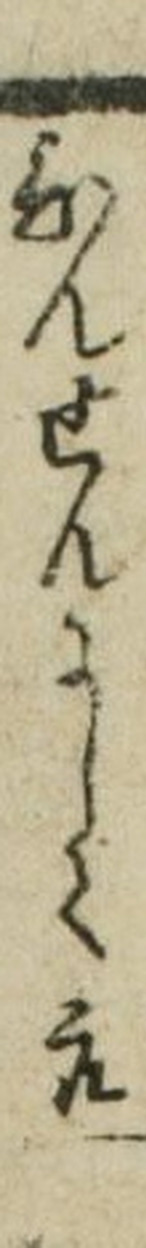ひんせんにして取
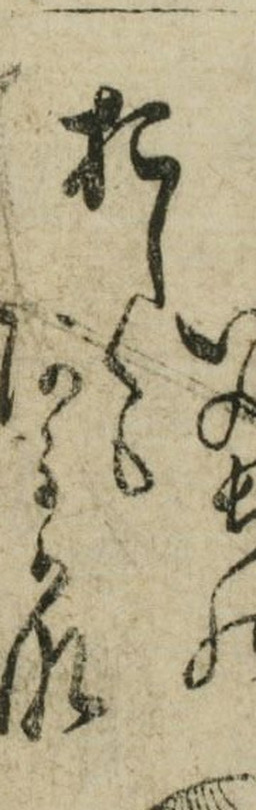おしくも
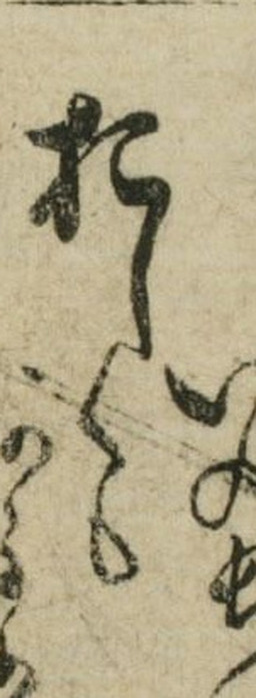おしくも
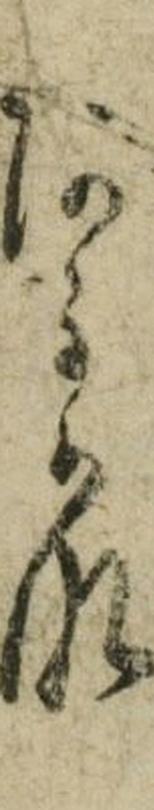あるかな
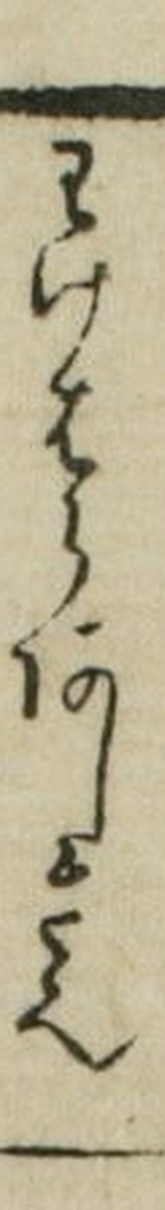わけはらあしき也
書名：百人一首
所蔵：東京学芸大学教育コンテンツアーカイブ
